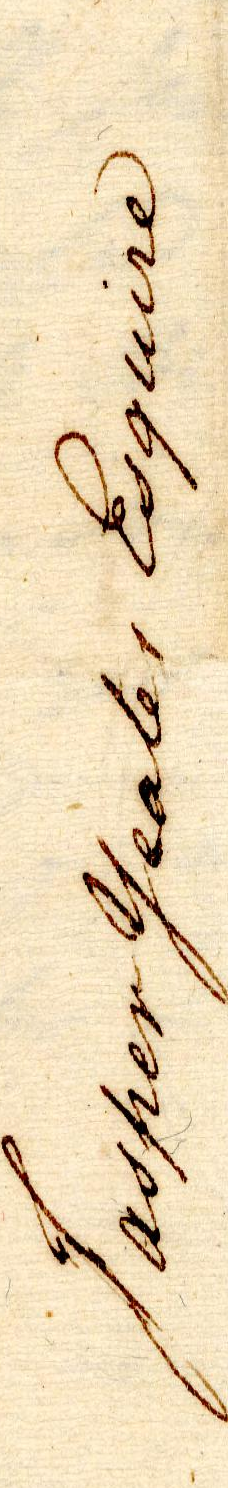Jasper Yeates Esquire
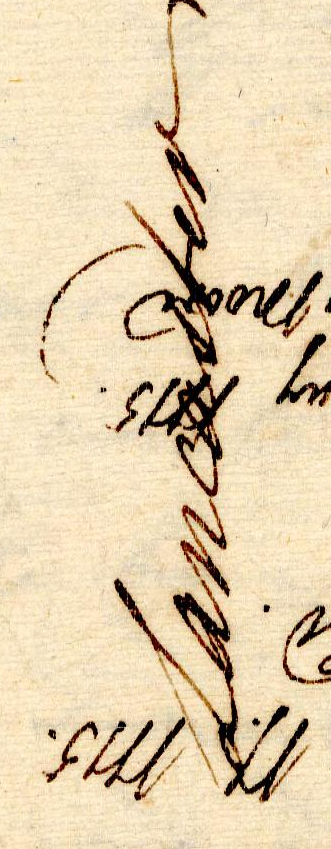Lancaster
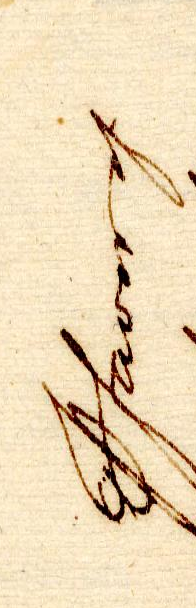Per favor of
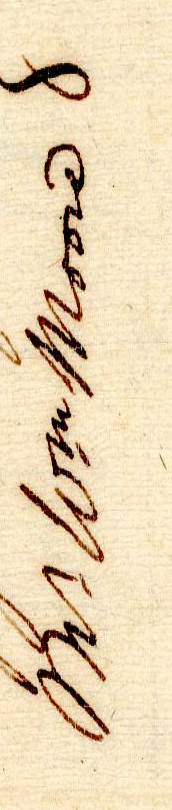M^r W^m. Moore
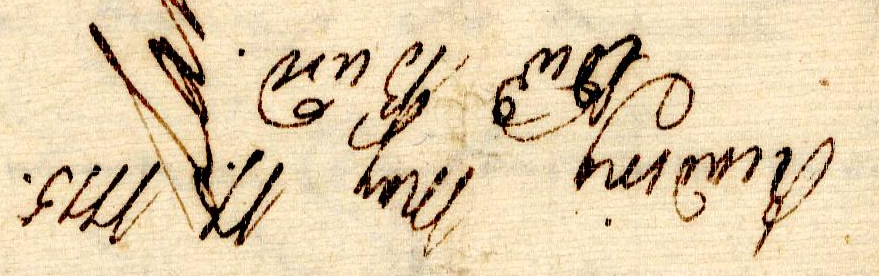Reading May 17. 1775.
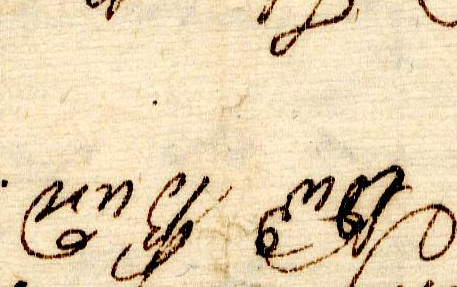Edw^d. Burd
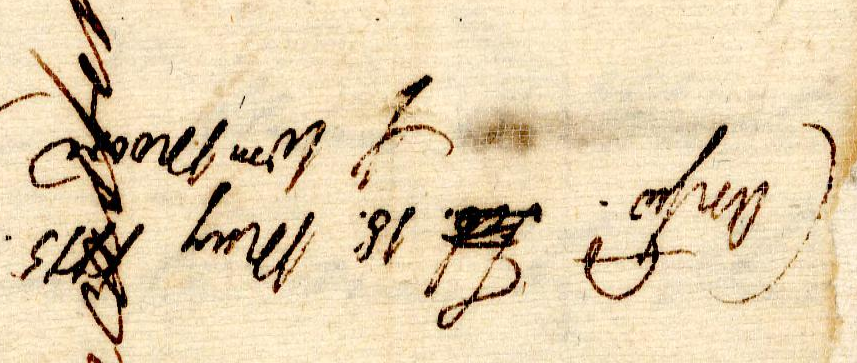(Answ^d. Feb. 18. May 1775.
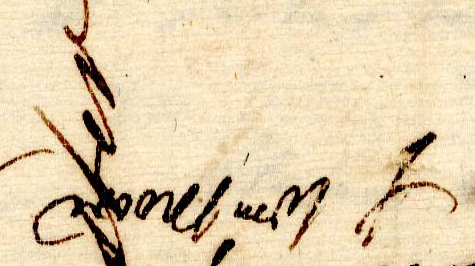Per W^m. Moore)
